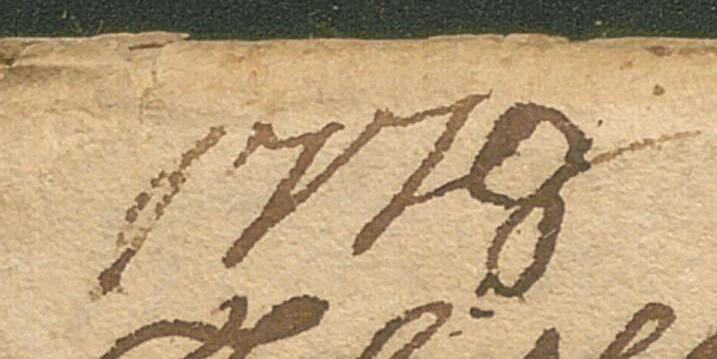1778
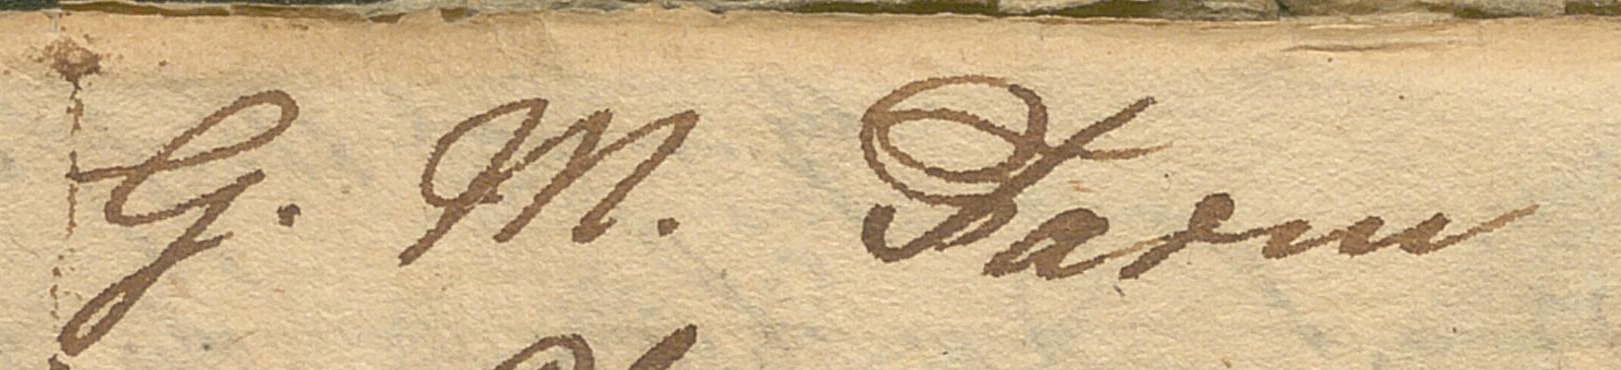G. M. Farm
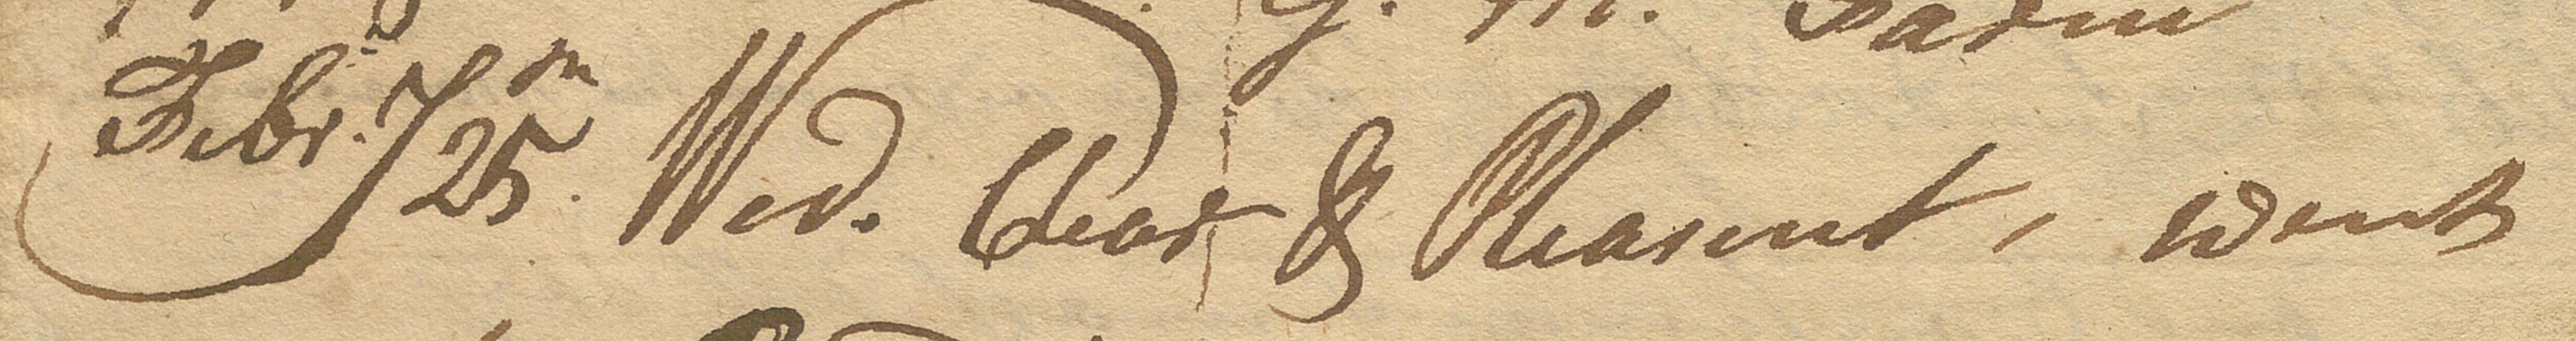Febr^y. 25^th Wed. Clear & Peasent, went
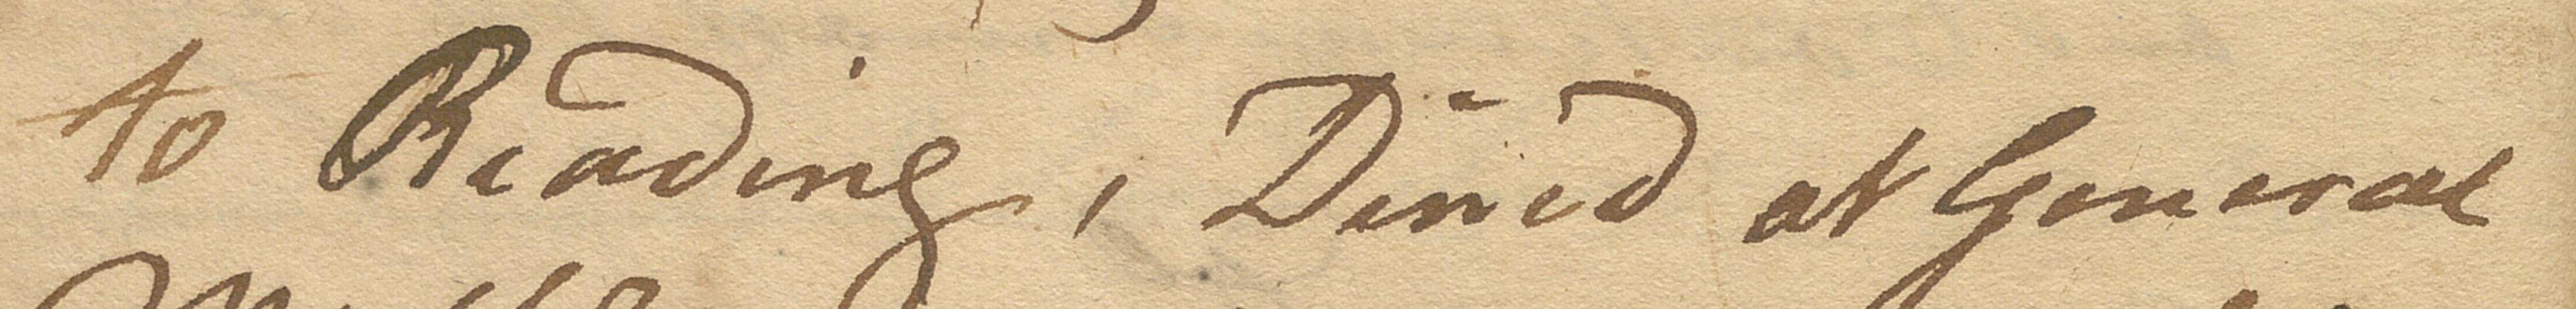to Reading, Dined at General
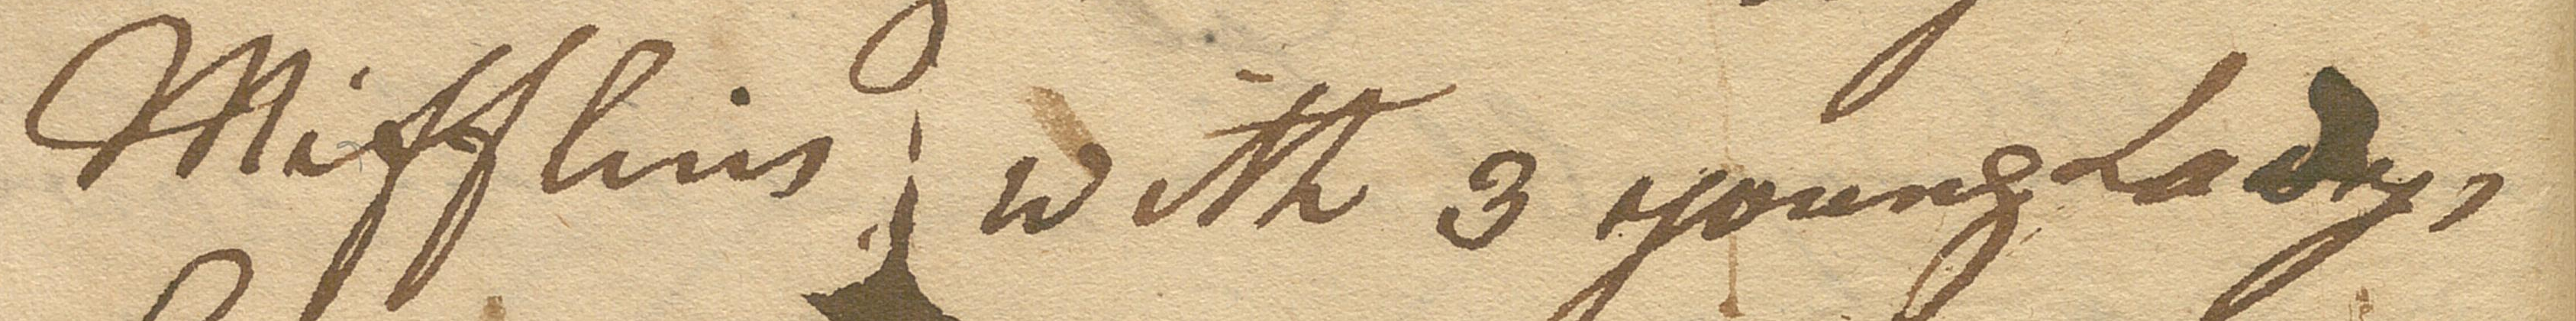Mifflins with 3 young Ladys
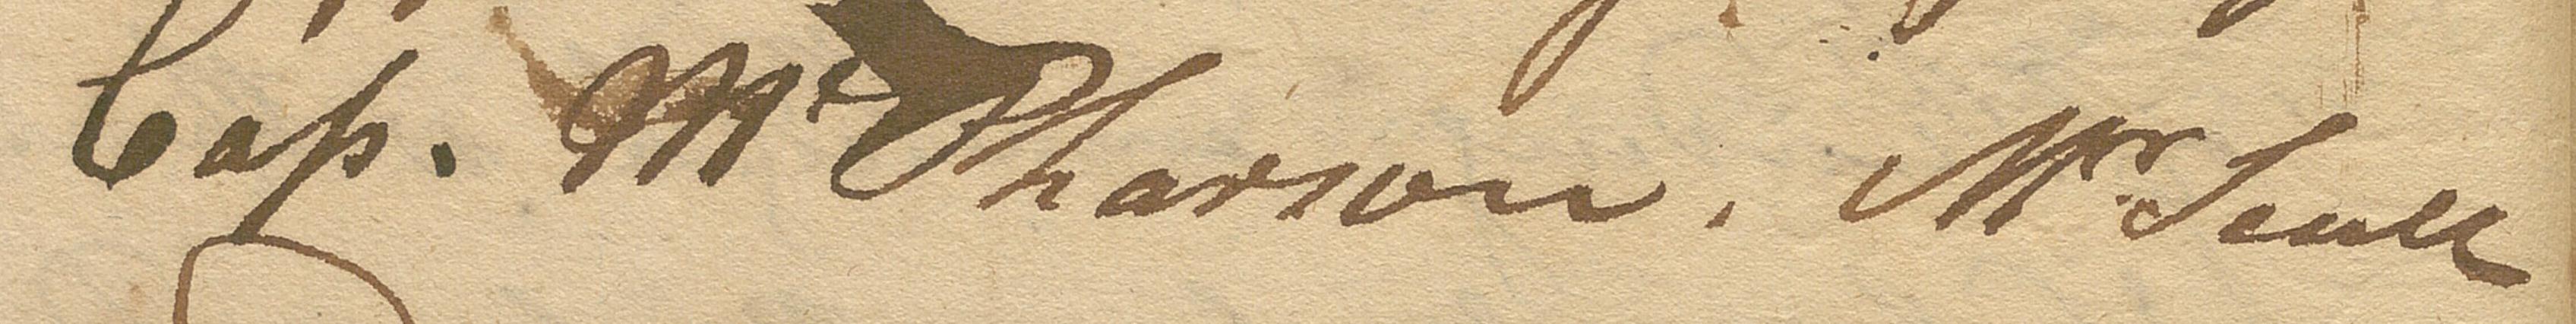Cap. M^r Pharson, M^r Seall
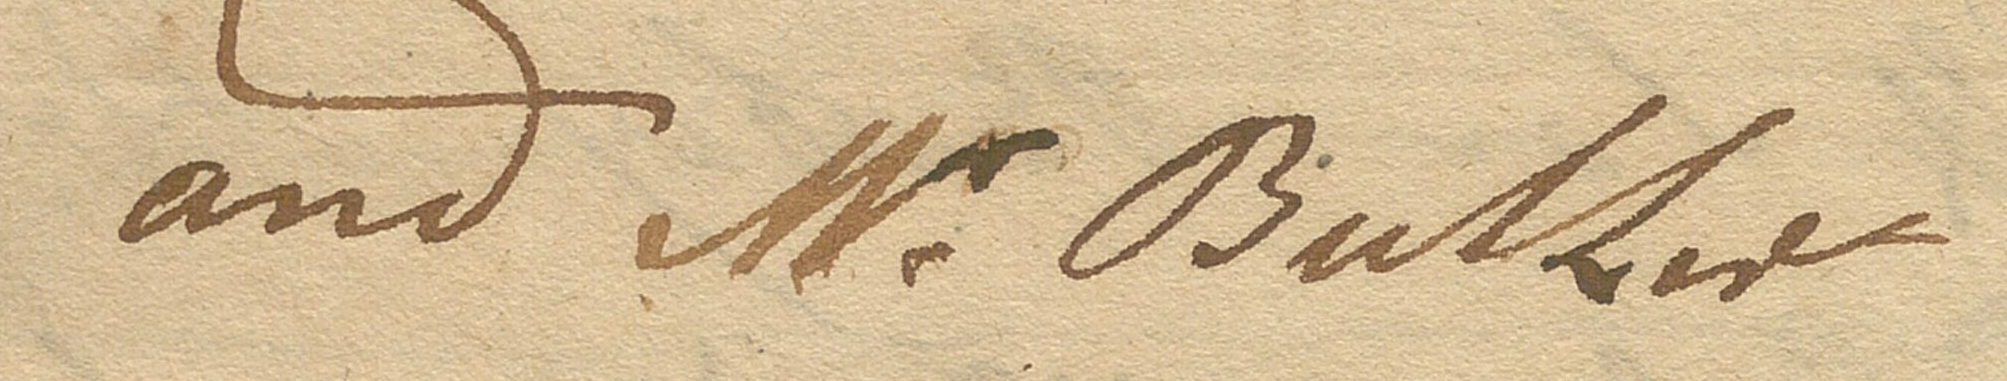and M^r. Butler
